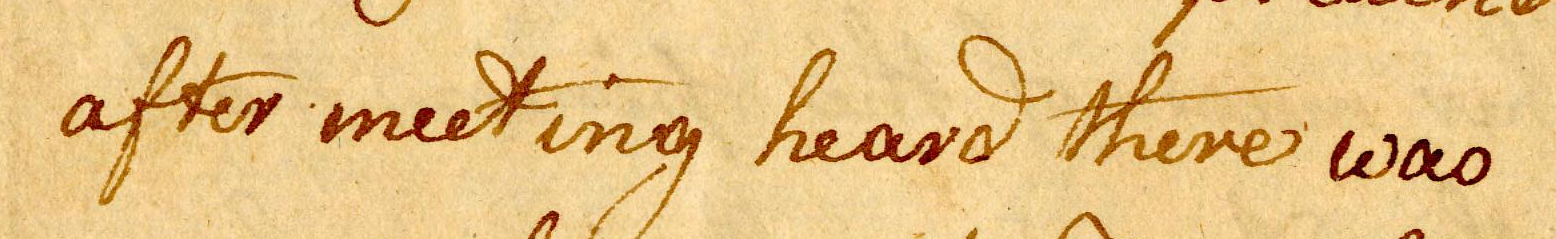after meeting heard there was
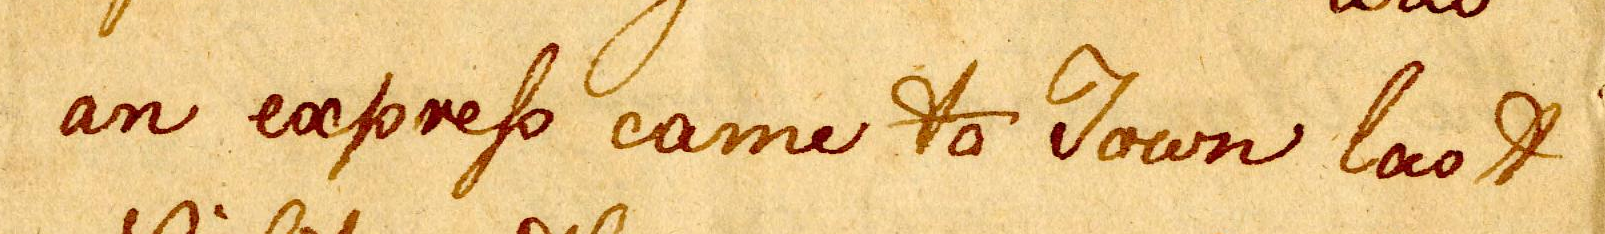an express came to Town last
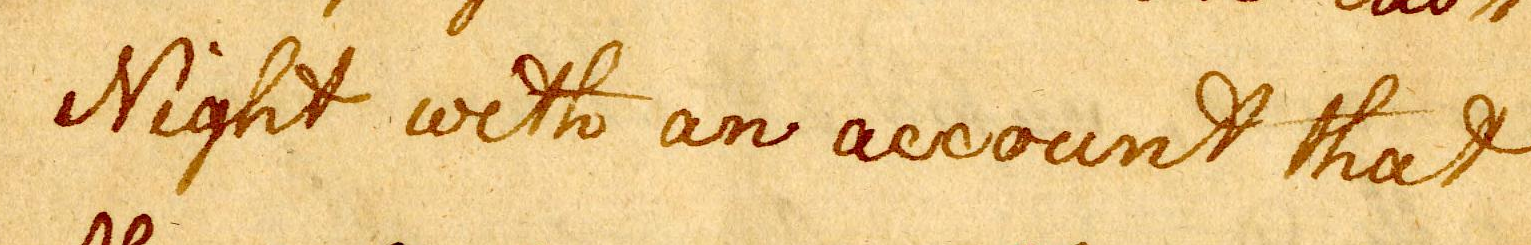Night with an account that
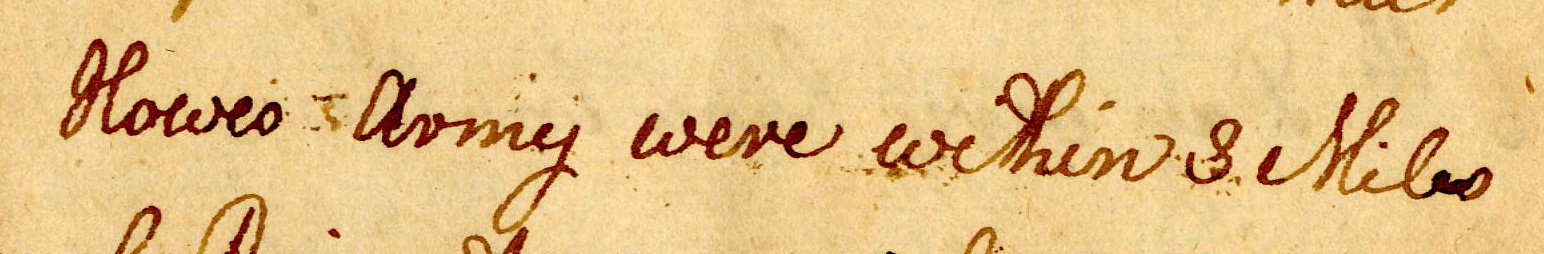Howes Army were within 3 Miles
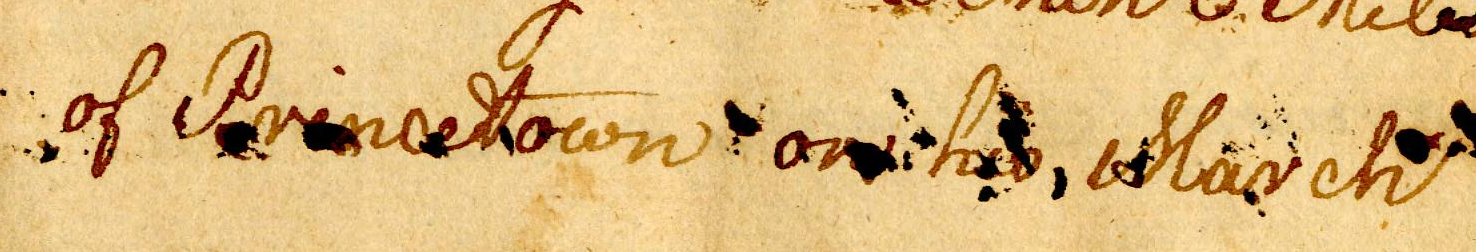of Princeton on his March
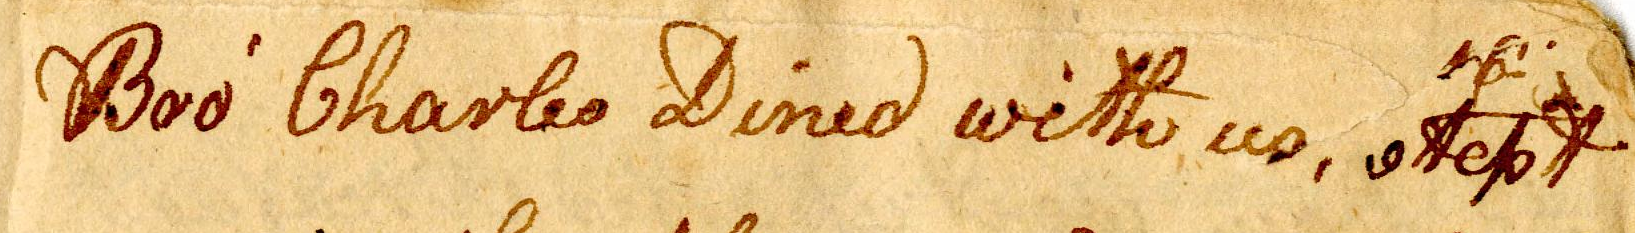Bro' Charles Dined with us, stept
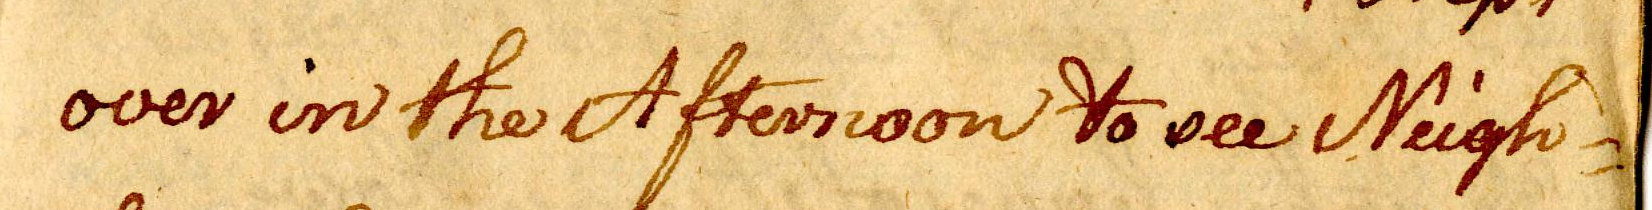over in the Afternoon to see Neigh-
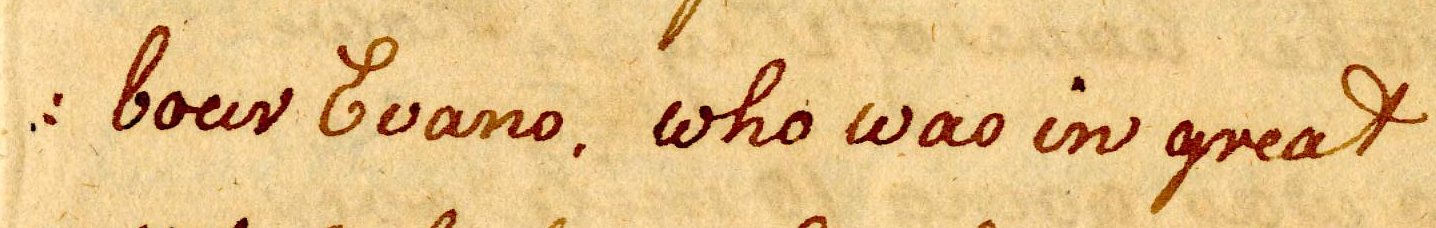-bour Evans, who was in great
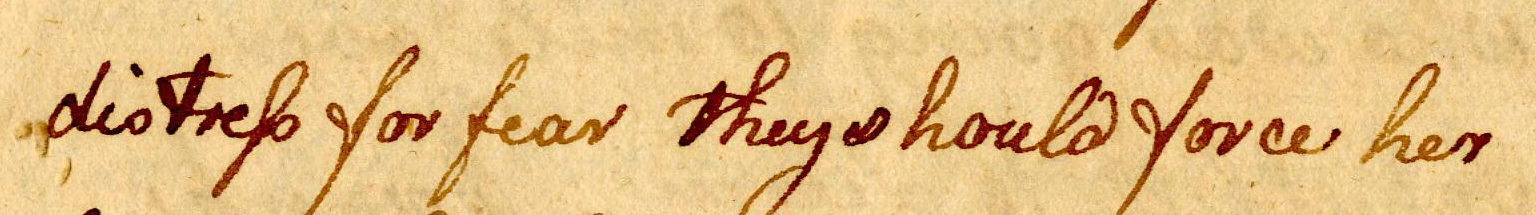distress for fear they should force her
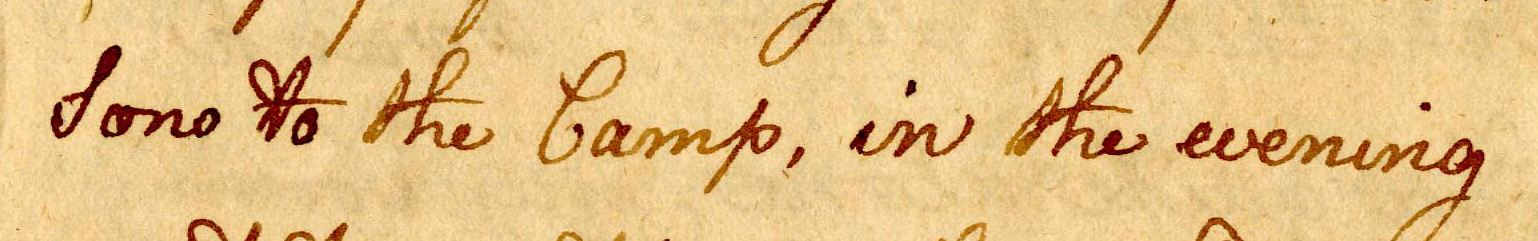Sons to the Camp, in the evening
